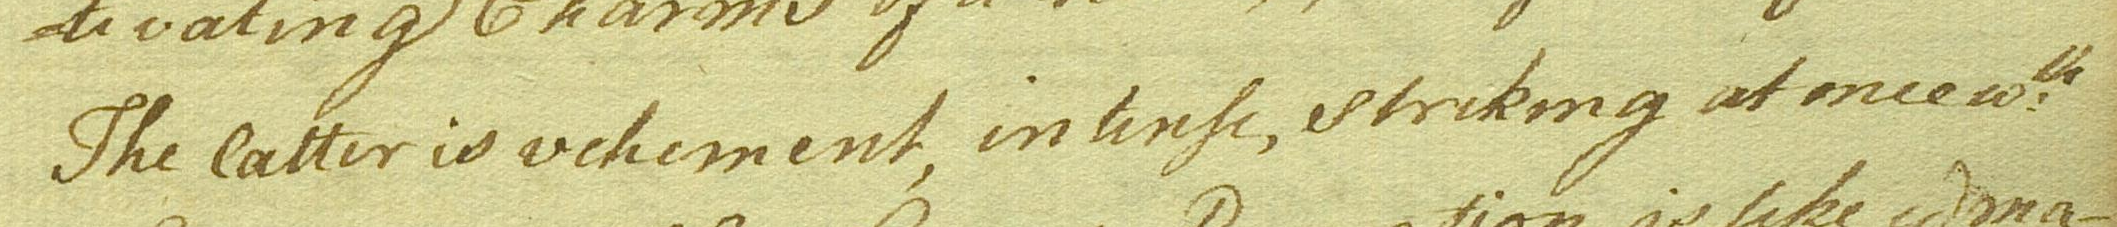The latter is vehement, intense, striking at once w^th
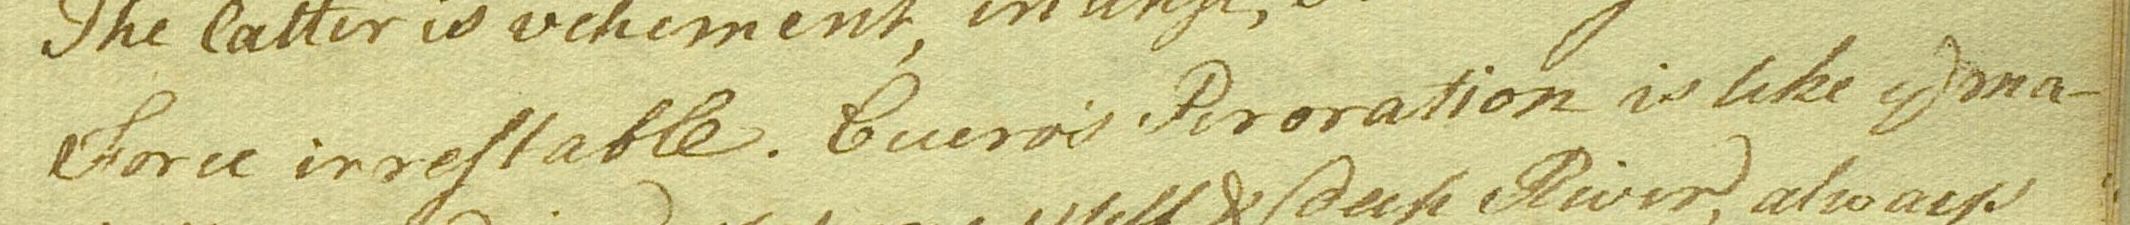Force irrestable. Cicero's Peroration is like a ma-
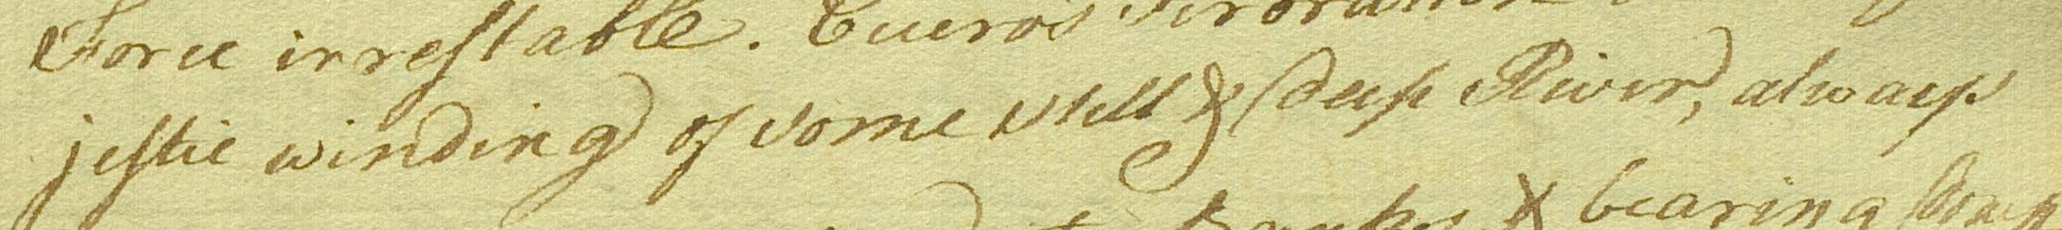jestic winding of some still & deep River, always
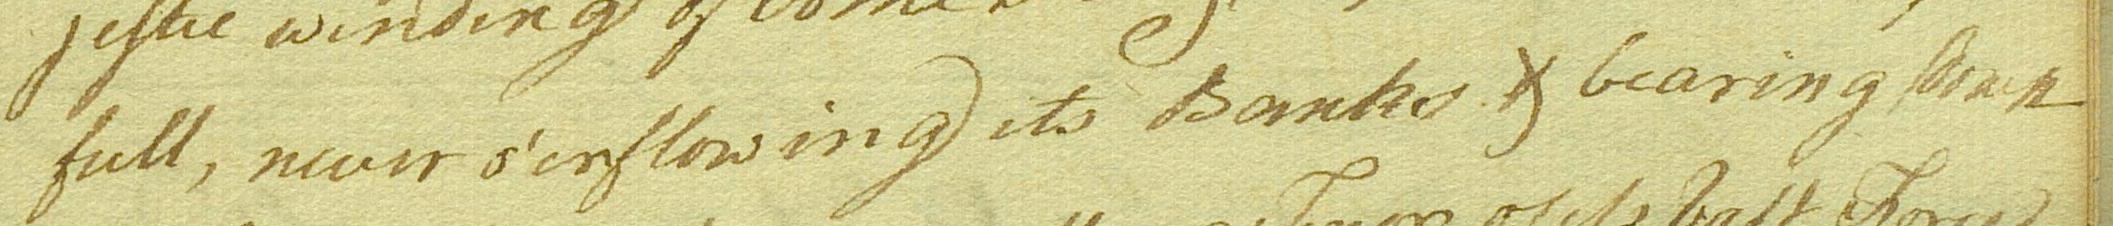full, never o'erflowing its Banks & bearing [____]
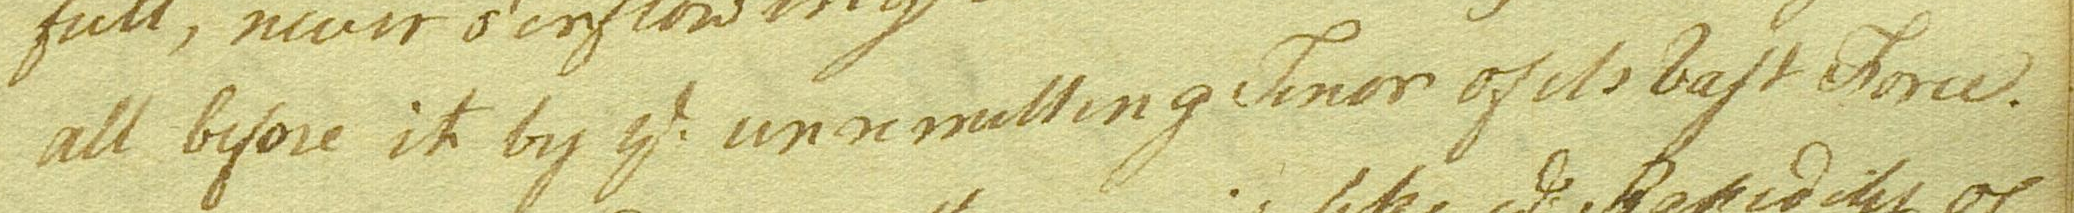all before it by y^e. unremitting Tenor of its last Force.
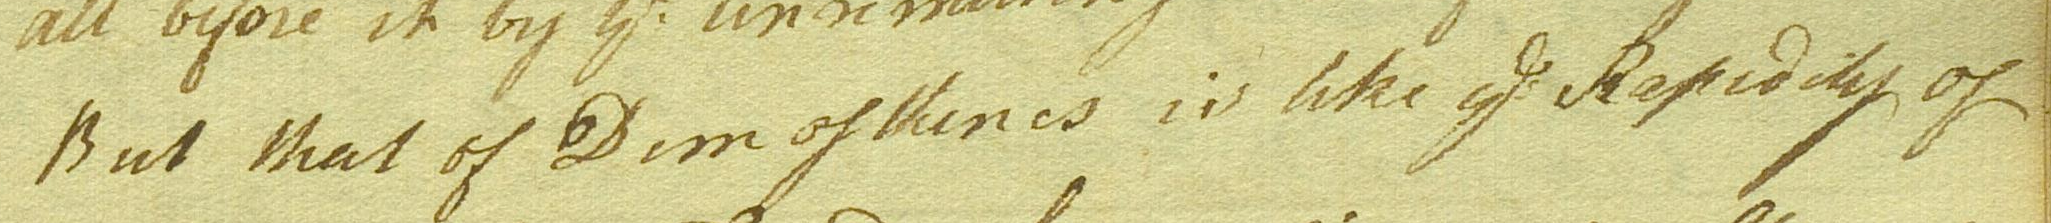But that of Demosthenes is like y^e Rapidity of
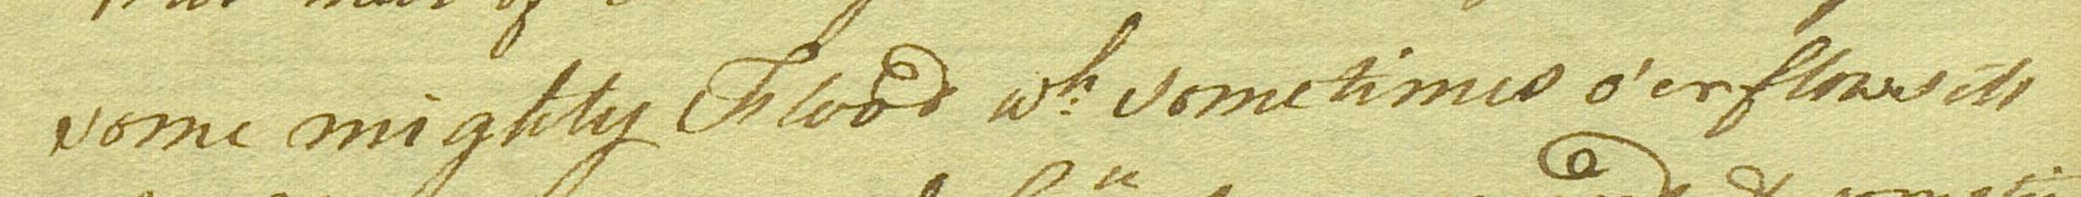some mighty Flood w^h: sometimes o'erflows its
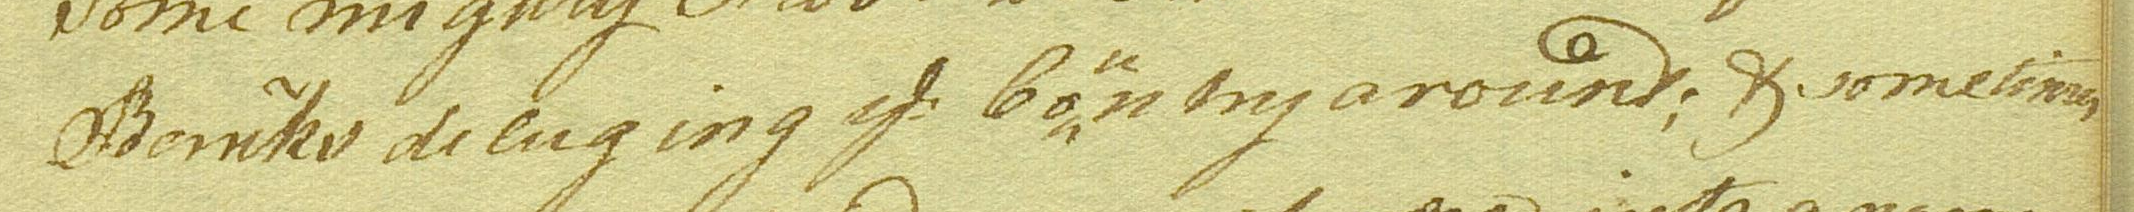Banks deluging y^e Co^untry around; & sometimes
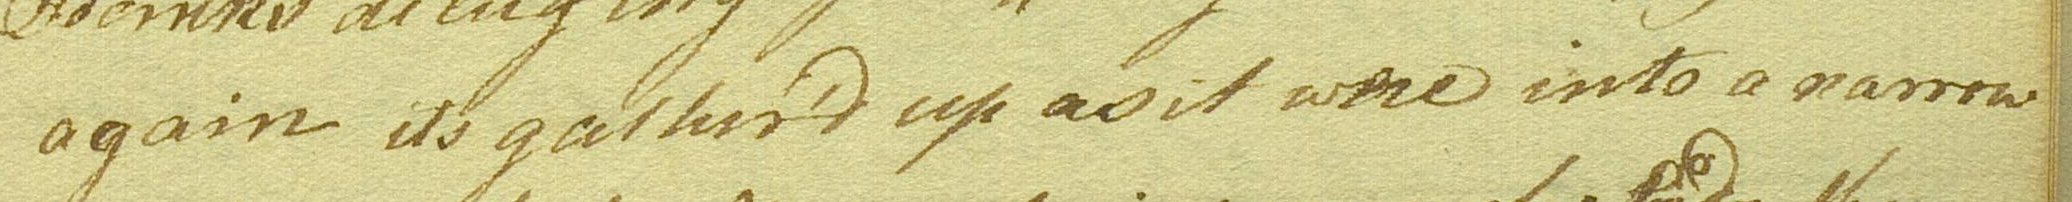again its gather'd up as it were into a narrow
